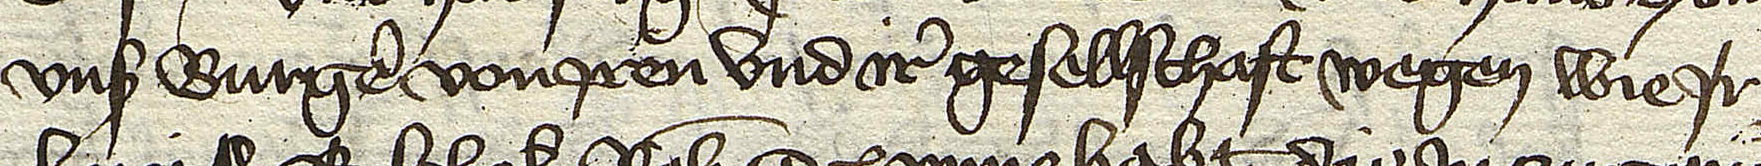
vnſ* Burge* von Iren Vnd ir* geſellſchaft wegen wie Ir
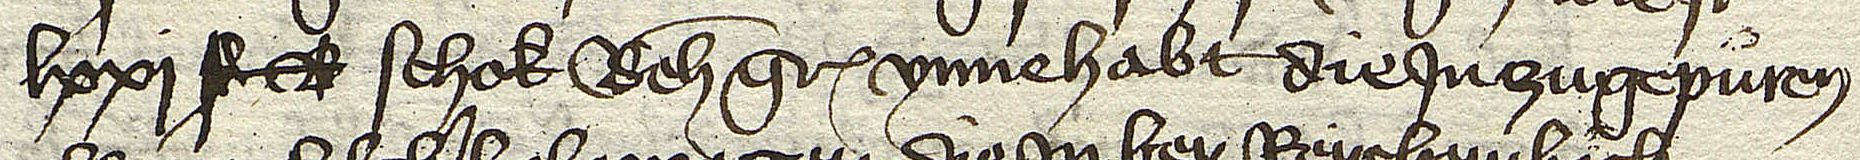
lxxi ſc B ſchok Beh* gr* ynnehabt die In cʒugepüren
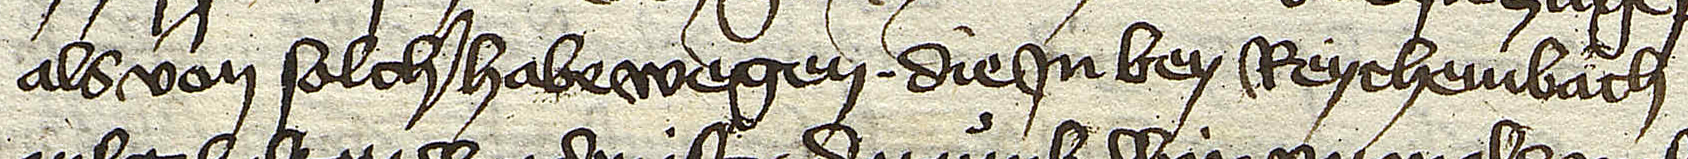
als von ſolch* habe wegen . die In bey Reychembach
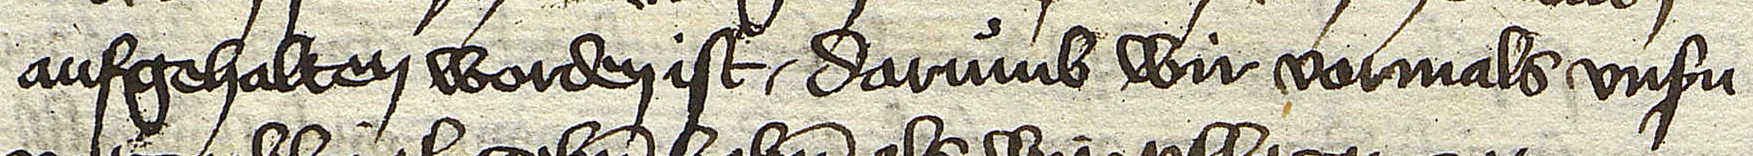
aufgehalten worden iſt / darümb wir vormals vnſ*n
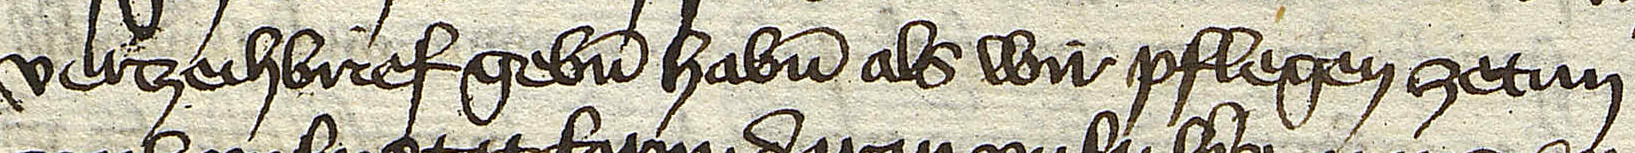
vercʒeihbrief geb*n hab*n als wir pflegen cʒetun
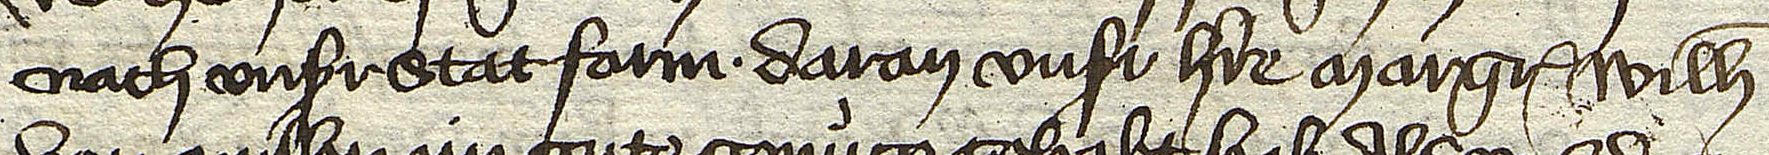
nach vnſ*r Stat form . daran vnſ*r h*re Margr* Wilh*
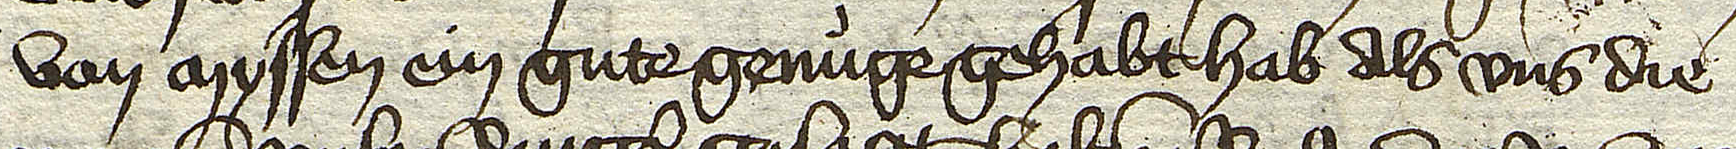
von Myſſen ein gute genüge gehabt hab Als vns die
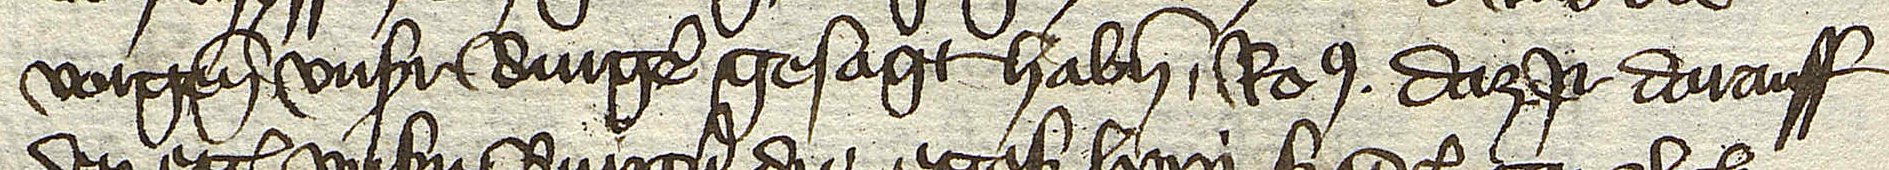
vorgen* vnſ*r Burge* geſagt hab*n / Ro* . daʒ Ir darauff
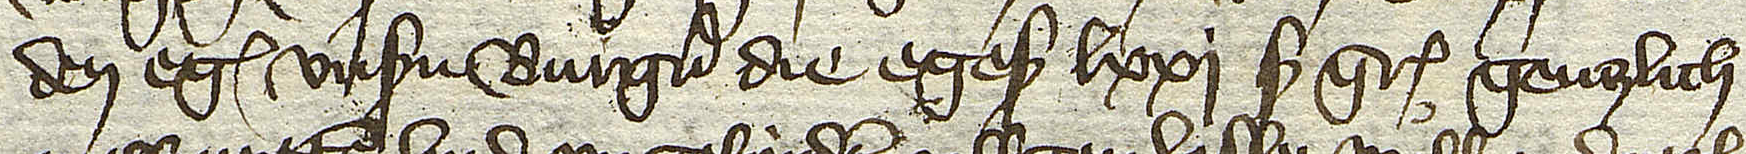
den eg* vnſ*n Burg*n die egeſ* lxxi ſ* gr* gencʒlich
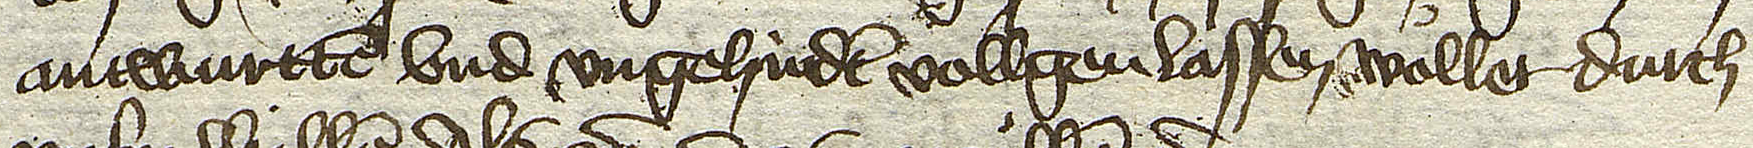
antwurtte* vnd vngehind*t vollgen laſſen wöllen durch
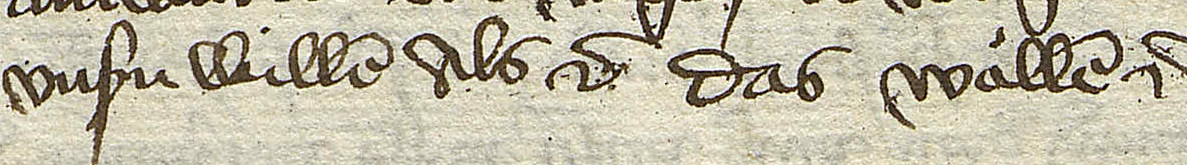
vnſ*n wille* Als ec* das wölle ec*
